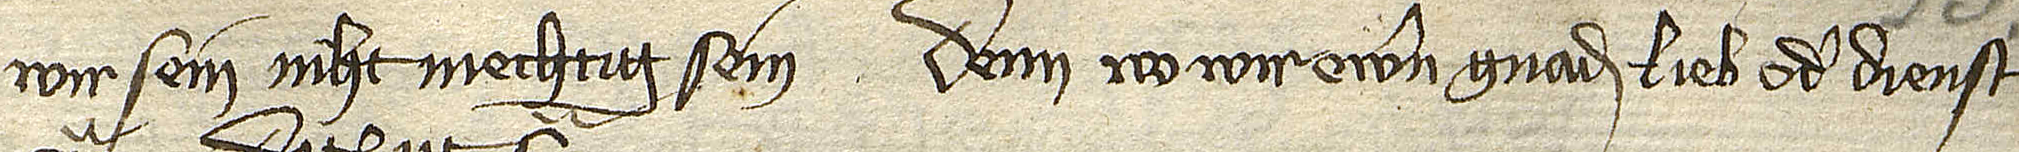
wir ſein niht mechtig ſein Denn wo wir eẅ*n gnad* lieb od* dienſt
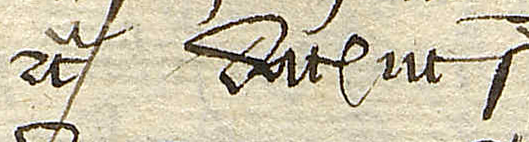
ec* / Dat* ut ſ*
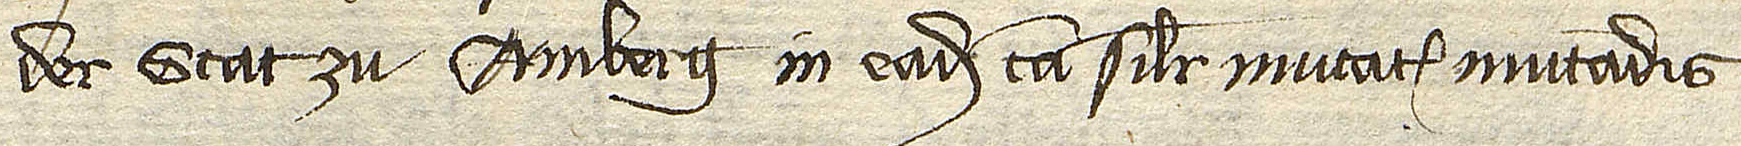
Der Stat ʒu Amberg in ead ca* ſilr* mutat* muta*dis
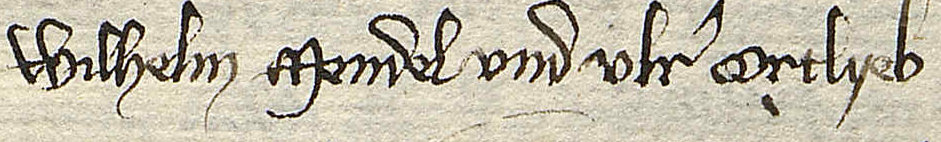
Wilhelm Mendel vnd vlr* Ortlyeb
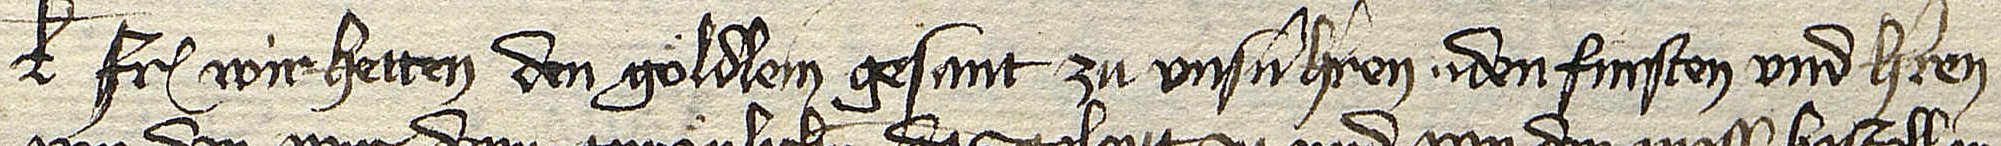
L* fr* wir hetten den göldlein geſant ʒu vnſn* h*ren ~ den fürſten vnd h*ren
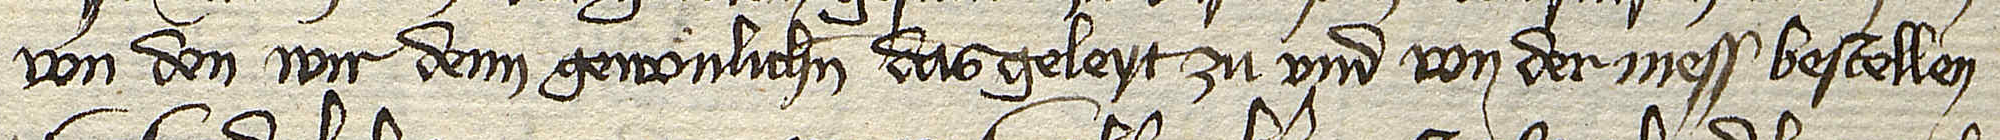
von den wir denn gewönlichn* das geleyt ʒu vnd von der meſſ beſtellen
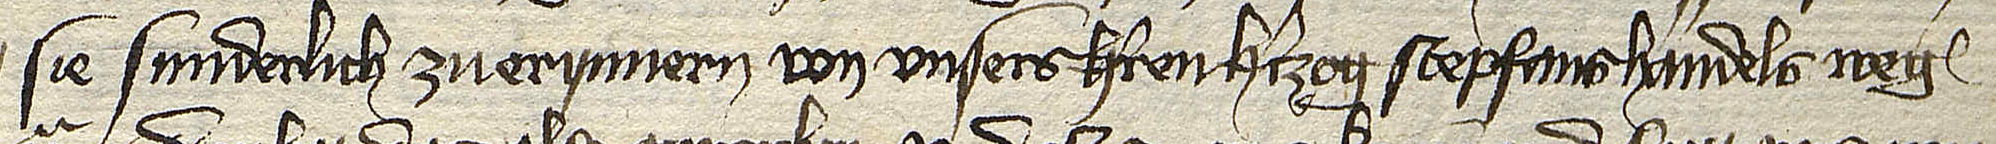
ſie ſunderlich ʒu erynnern von vnſers h*ren h*cʒog ſtepfans handels weg*
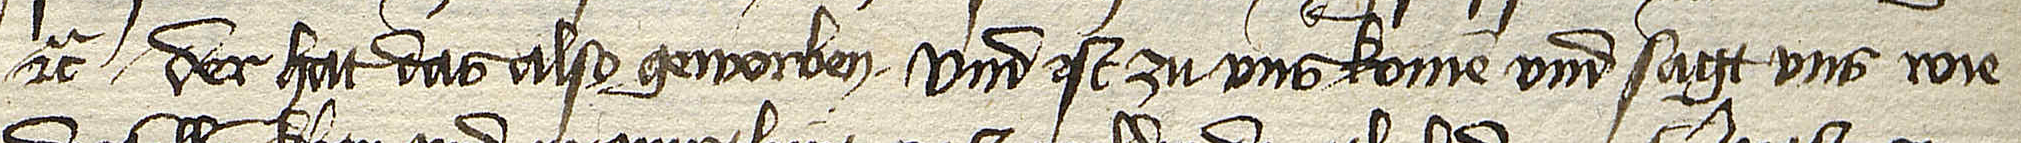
ec* / Der hat das alſo geworben / vnd iſt ʒu vns kome* vnd ſagt vns wie
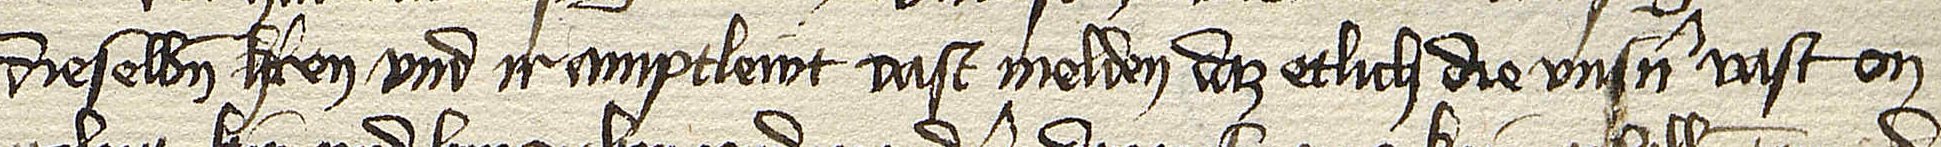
dieſelbn* h*ren vnd ir amptleẅt vaſt melden daʒ etlich die vnſn* vaſt on
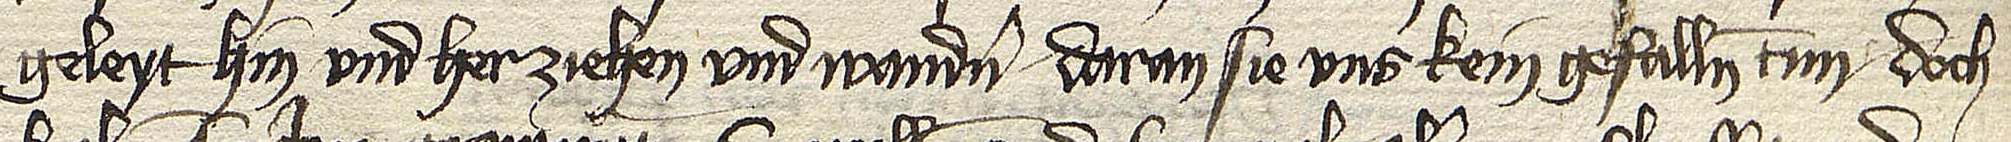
geleyt hin vnd her ʒiehen vnd wandn* / Daran ſie vns kein gefalln* tun / Doch
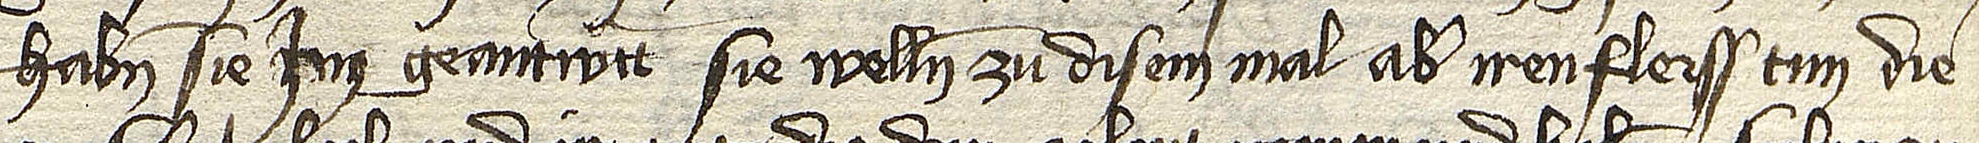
habn* ſie Im geantw*tt ſie welln* ʒu diſem mal ab* iren fleiſſ tun die
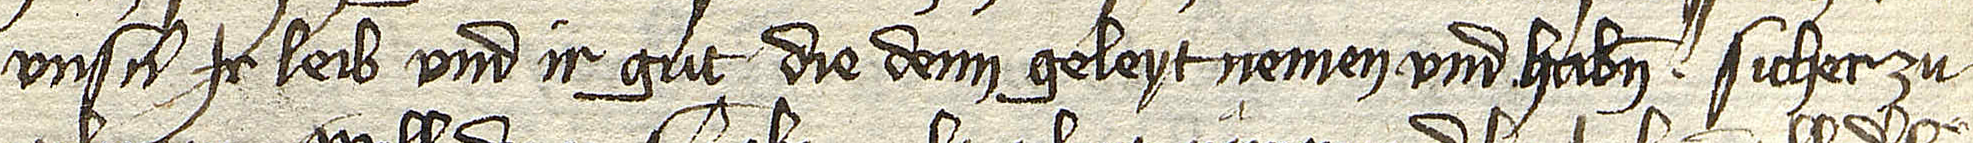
vnſn* Ir leib vnd ir gut / die denn geleyt nemen vnd habn* . ſicher ʒu
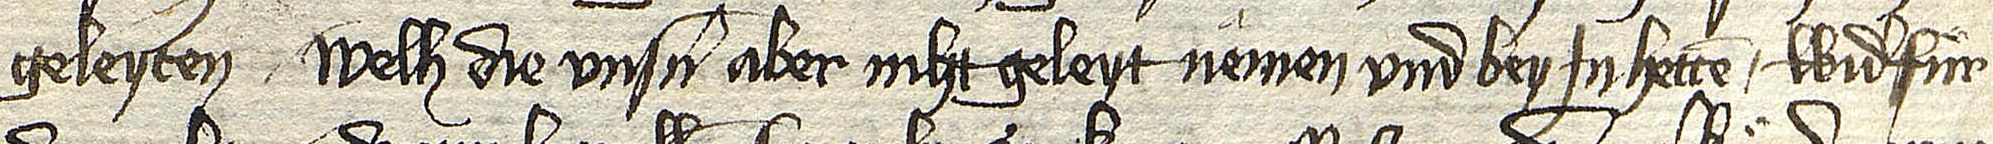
geleyten / welh die vnſn* aber niht geleyt nemen vnd bey In hette* / Wid*für
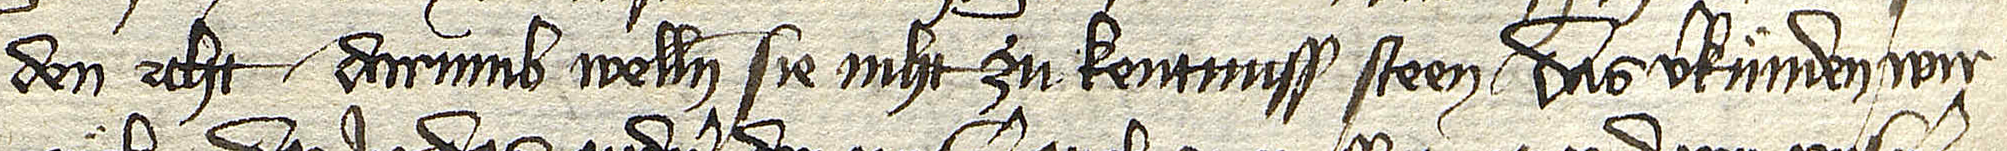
den icht / darumb welln* ſie niht ʒu kentnuſſ ſteen / Das v*künden wir
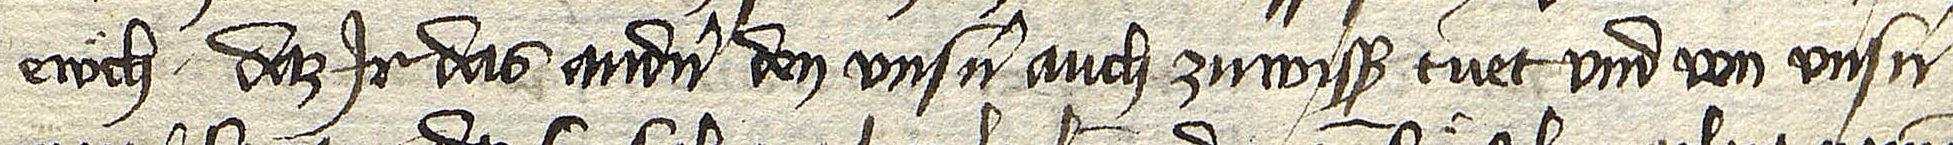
eẅch / Daʒ Ir das andn* den vnſn* auch ʒuwiſſ* tuet vnd von vnſn*
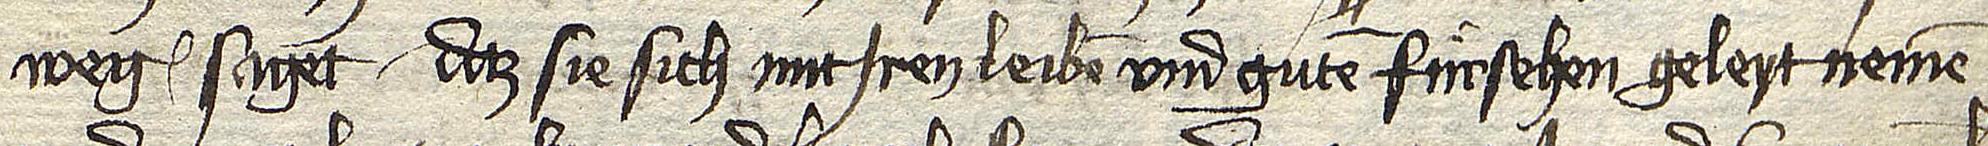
weg* ſaget / daʒ ſie ſich mit Iren leibe* vnd gute* fürſehen geleyt neme*
